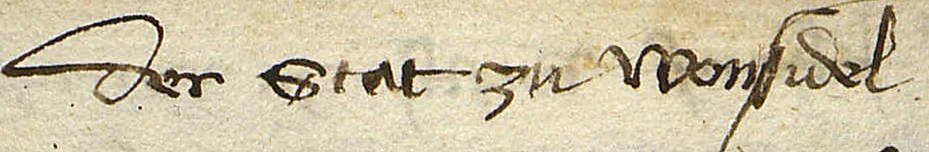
Der Stat ʒu Wonſidel
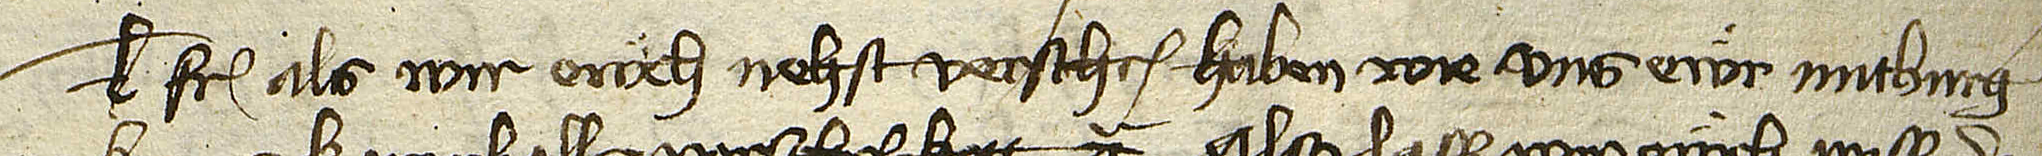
L* fr* als wir eẅch nehſt verſchr* haben wie vns eẅr mitburg*
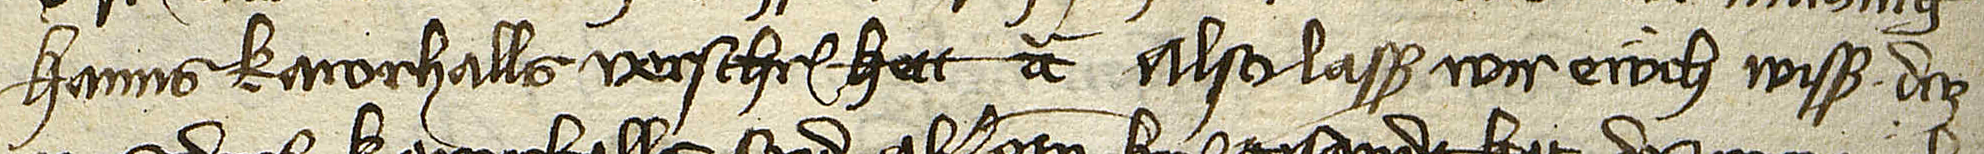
hanns kawrhalls verſchr* hat ec* Alſo laſſ* wir eẅch wiſſ* . daʒ
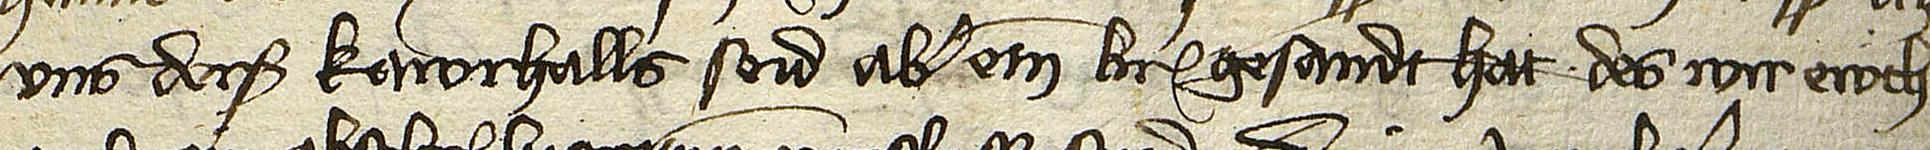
vns derſ* kawrhalls ſeid ab* ein b*r geſandt hat . des wir eẅch
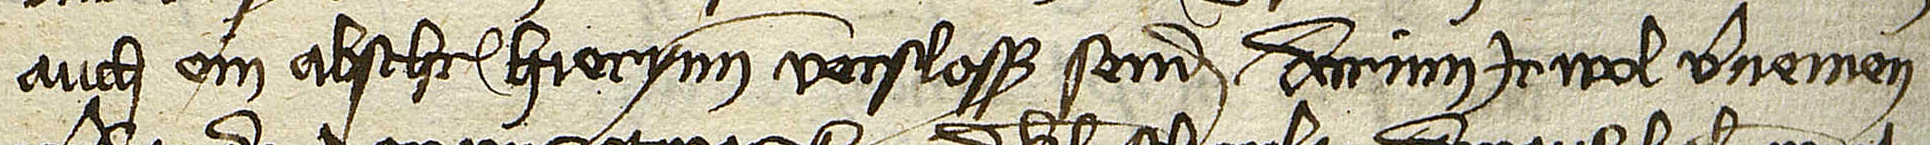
auch ein abſchr* hierynn* verſloſſ* ſend* / Darinn Ir wol v*nemen
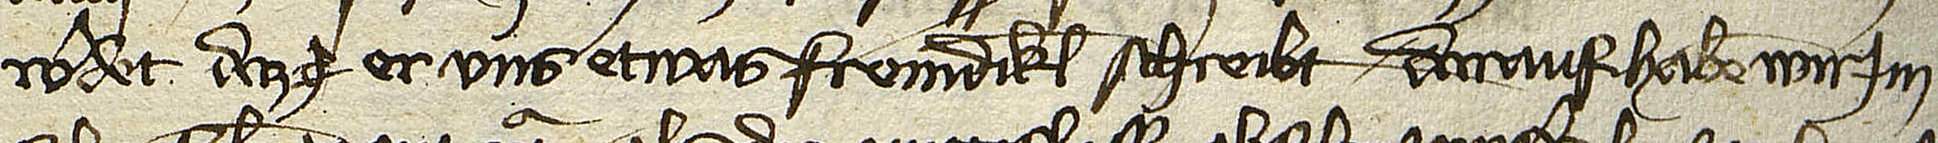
w*det . daʒ er vns etwas fremdikl* ſchreibt / Darauf habe* wir Im
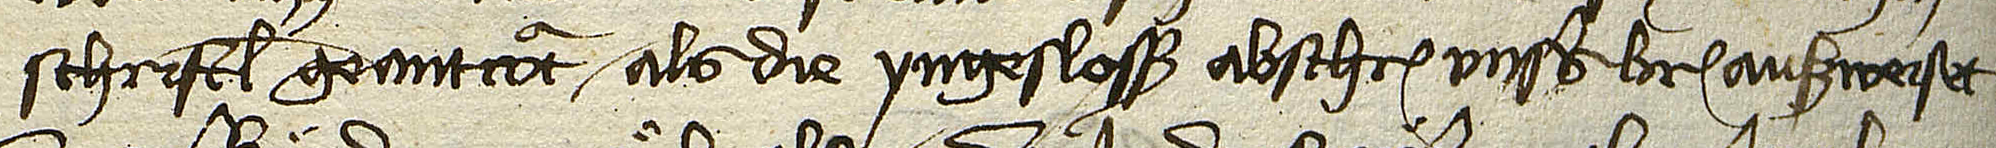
ſchriftl* geantw*t / als die yngeſloſſ abſchr* vnſ*s b*r auſʒweiſet
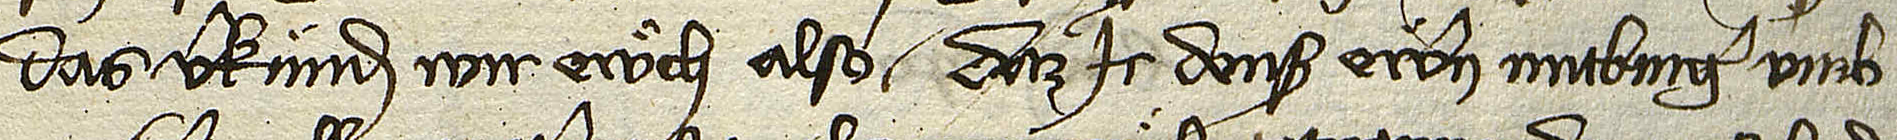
Das v*künd* wir eẅch alſo / Daʒ Ir denſ* eẅ*n mitburg* vmb
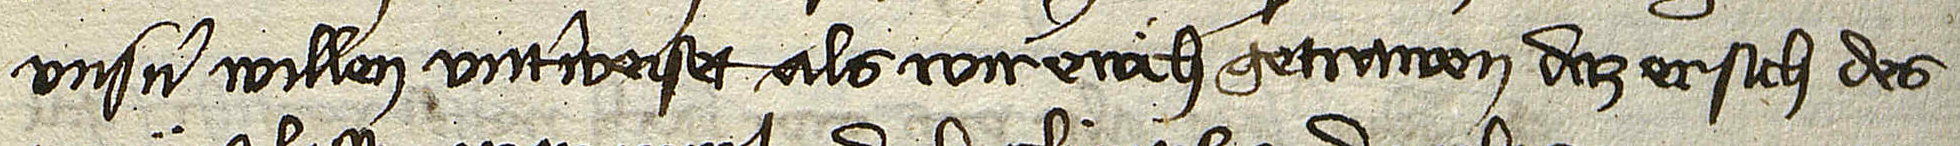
vnſ*n willen vnt*weiſet als wir ewch getrawen daʒ er ſich des
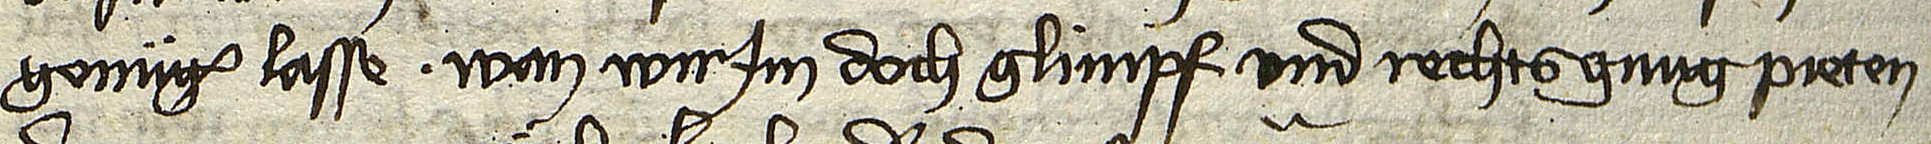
genüg* laſſe . wan* wir Im doch glimpf vnd rechts gnug pieten
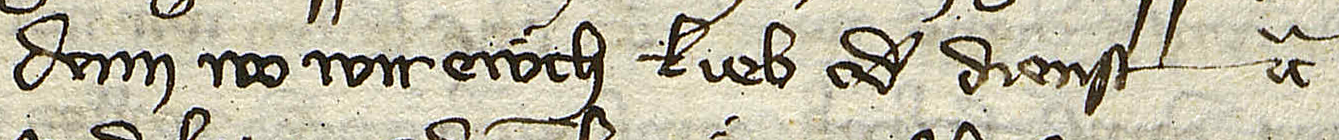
Denn wo wir eẅch lieb od* dienſt ec*
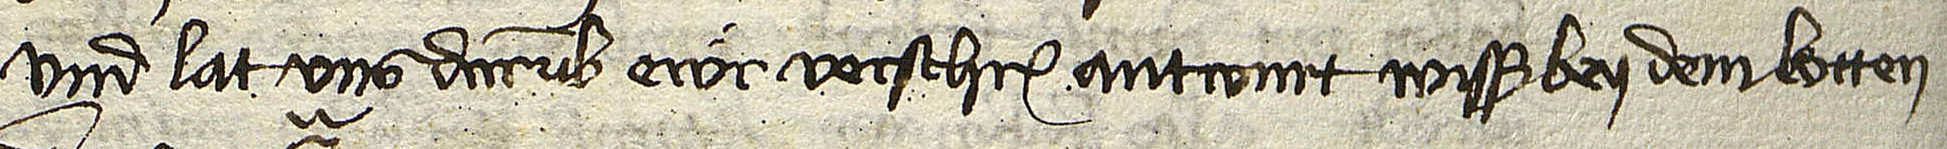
vnd lat vns darub* eẅr verſchr* antwurt wiſſ* bey dem botten
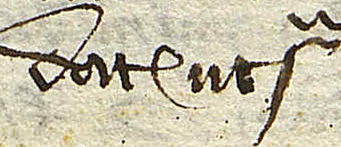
Dat* ut ſ*
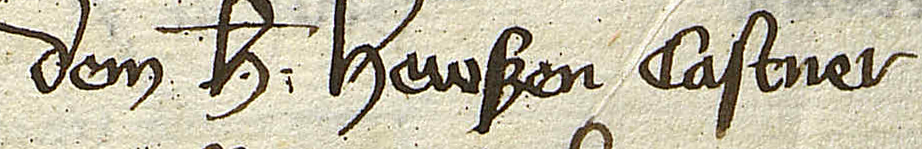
Dem H* Hewſʒen Caſtner
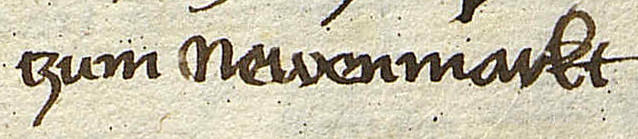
cʒum Newenmarkt
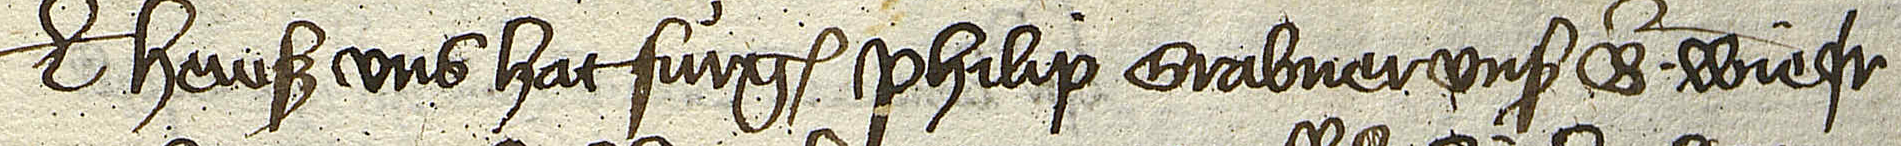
L* Hewſ* vns hat fürg* Philip Grabner vnſ* b* . wie Ir
